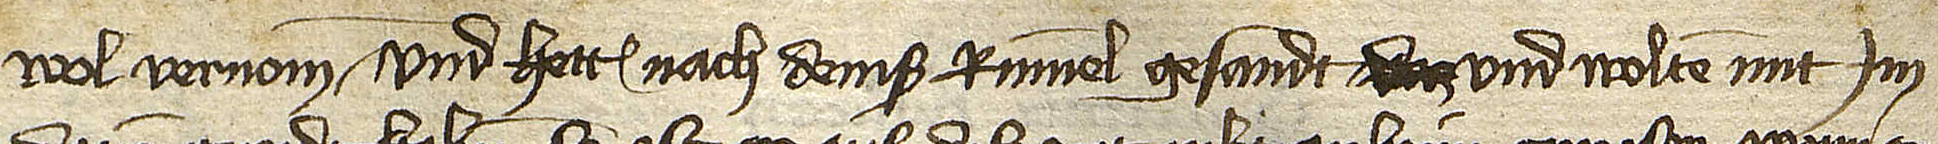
wol vernom* / vnd hett* nach demſ* Rum*el geſandt / daʒ vnd wolte* mit Im
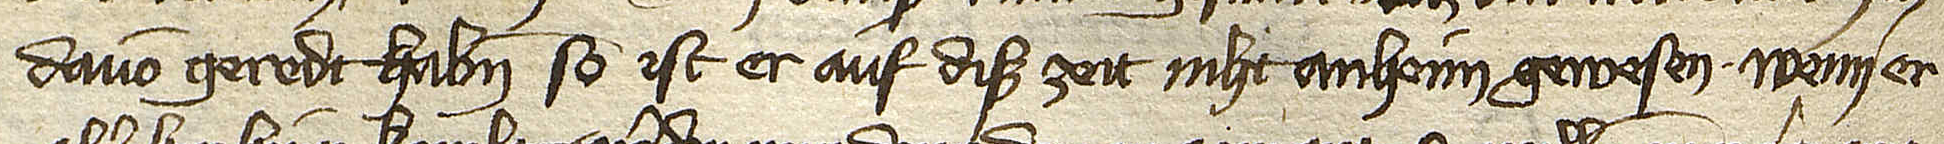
dauo* geredt habn* ſo iſt er auf diſʒ ʒeit niht anheim geweſen . wenn er
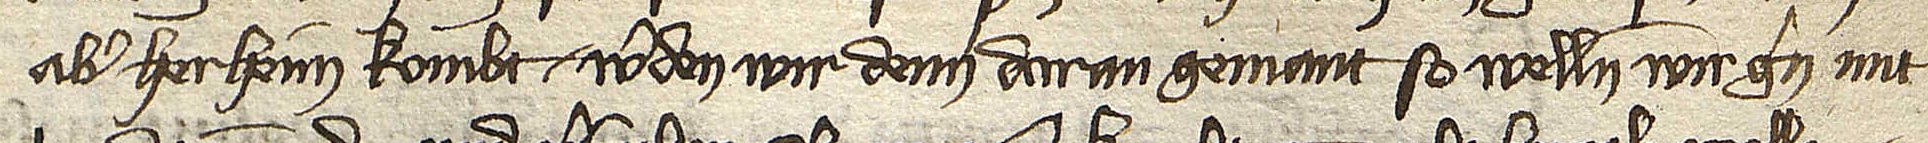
ab* herheim kombt / w*den wir denn daran gemant ſo welln* wir g*n mit
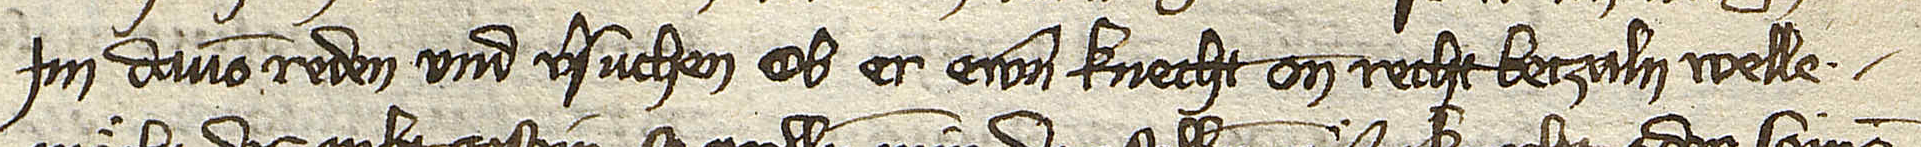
Im dauo* reden vnd v*ſuchen Ob er ew*n knecht on recht becʒaln welle . /
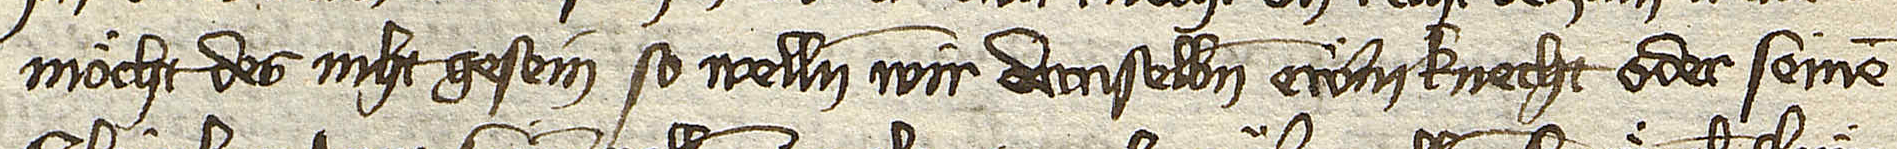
möcht des niht geſein ſo welln* wir demſelbn* eẅ*m knecht oder ſeine*
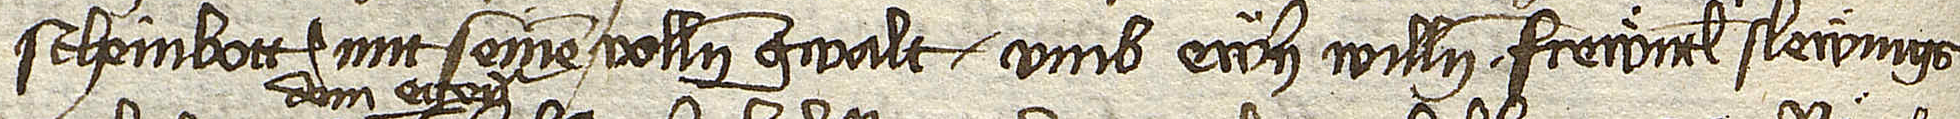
ſcheinbott* mit ſeine* volln* gwalt / vmb eẅ*n willn* / freẅntl* ſleẅnigs
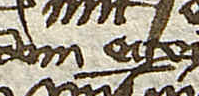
dem egen*
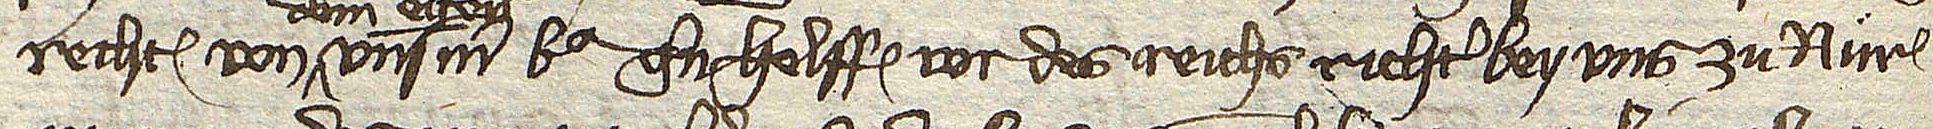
recht* von vnſm* b* g*n helff* vor des reichs richt* bey vns ʒu Nür*
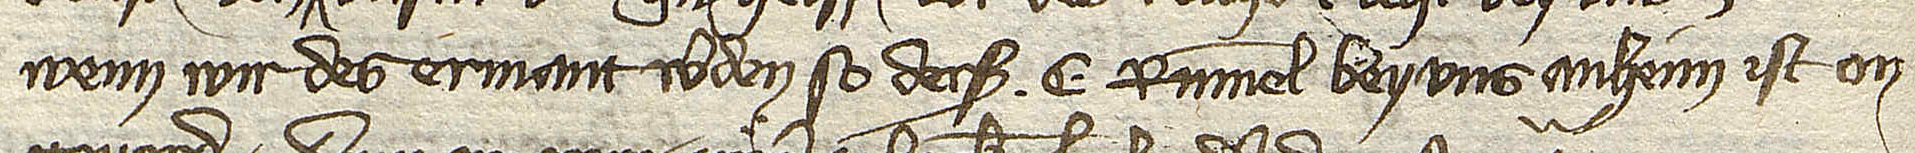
wenn wir des ermant w*den ſo derſ* . C . Rum*el bey vns anheim iſt on
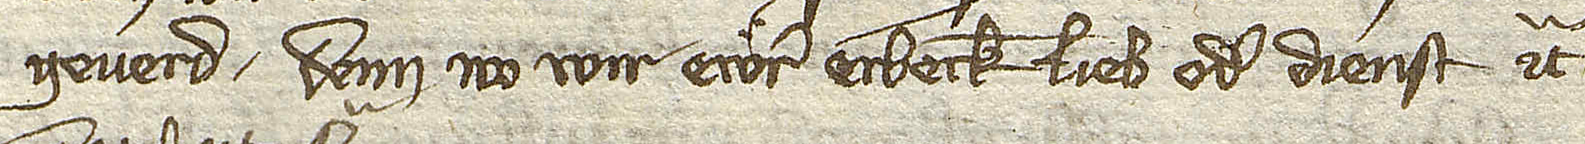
geuerd / Denn wo wir eẅr* erberk* lieb od* dienſt ec*
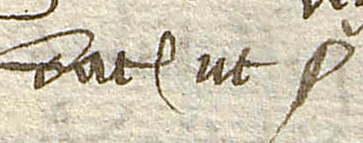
Dat* ut ſ*
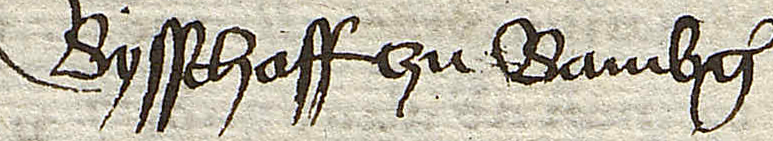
Byſſchoff cʒu Bamb*g
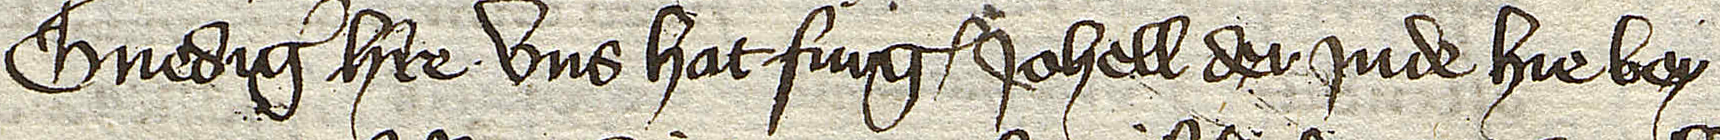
Gnedig* h*re . Vns hat fürg* Iohell der Iuden hie bey
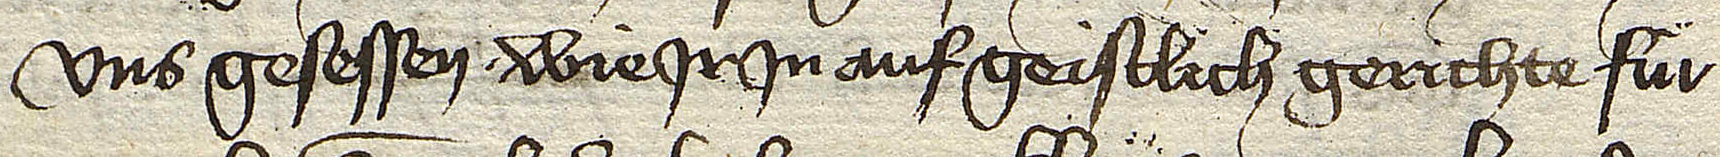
vns geſeſſen . wie Ir In auf geiſtlich gerichte für
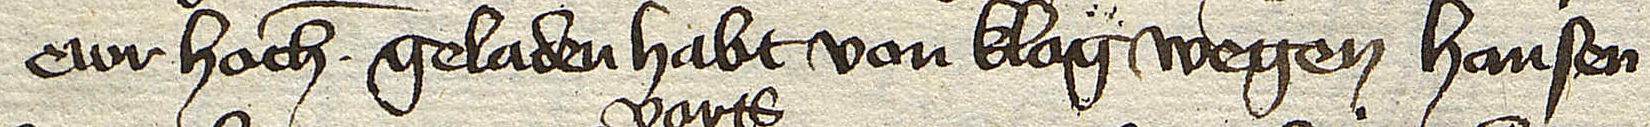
ewr hoch* geladen habt von klag wegen hanſen
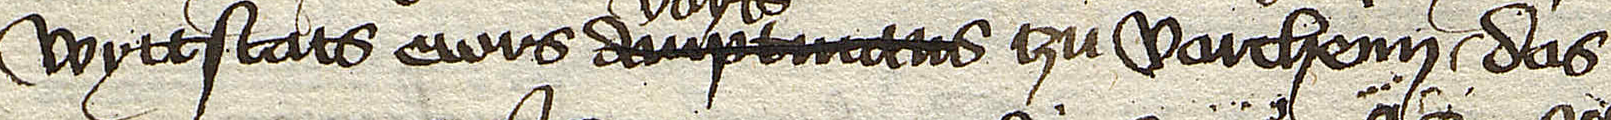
wyttſtats ewrs Amptmans cʒu vorcheim / das
